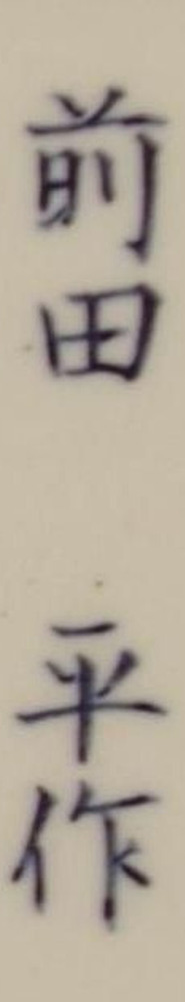前田平作
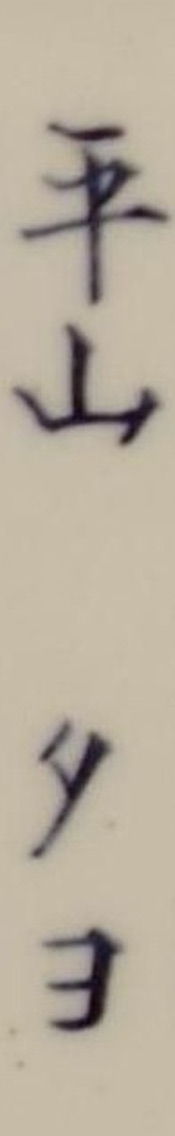平山タヨ
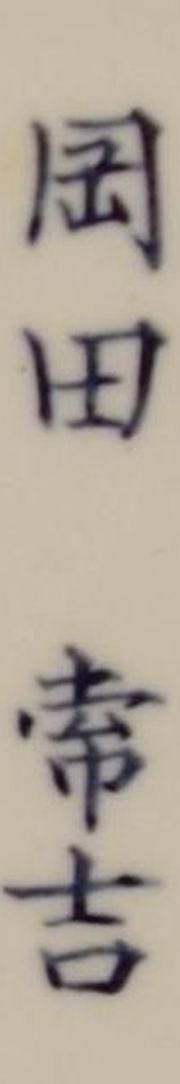岡田常吉
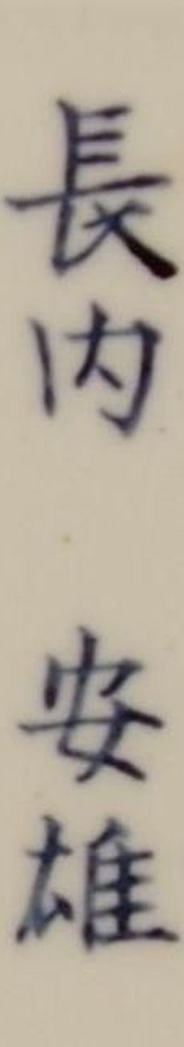長内安雄
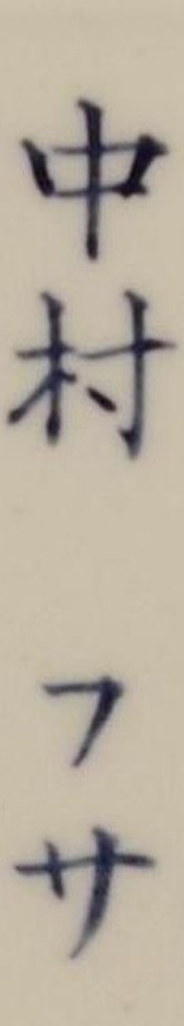中村フサ
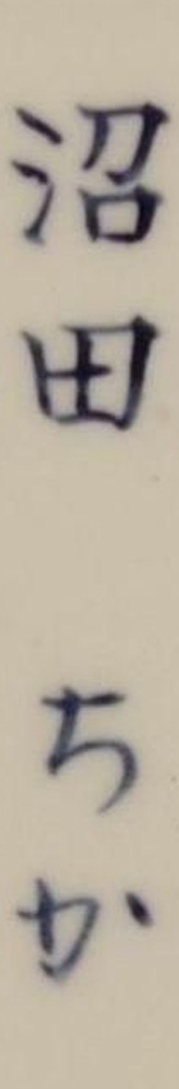沼田ちか
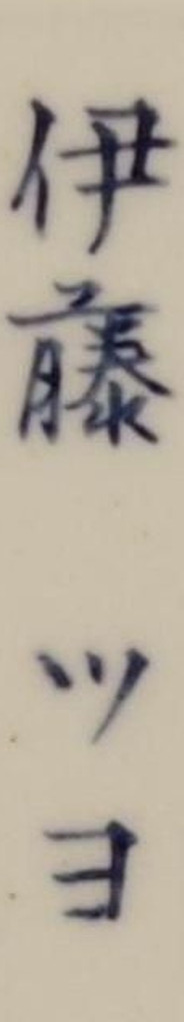伊藤ツヨ
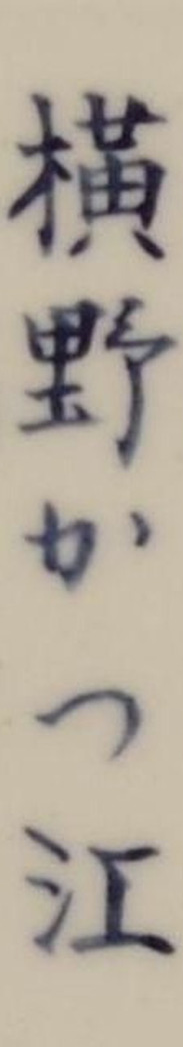横野かつ江
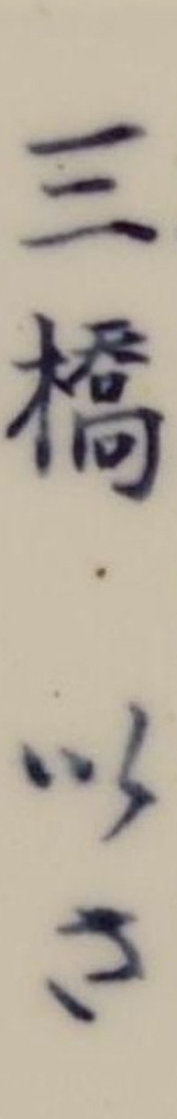三橋いさ
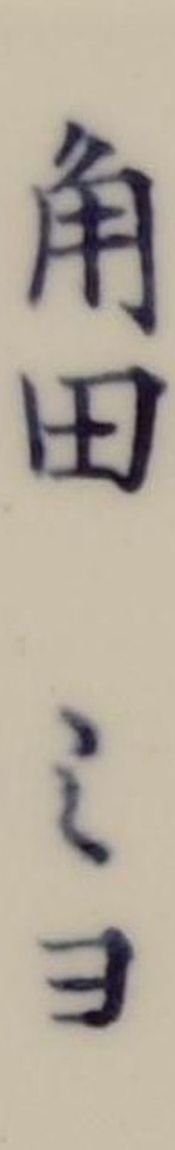角田ミヨ
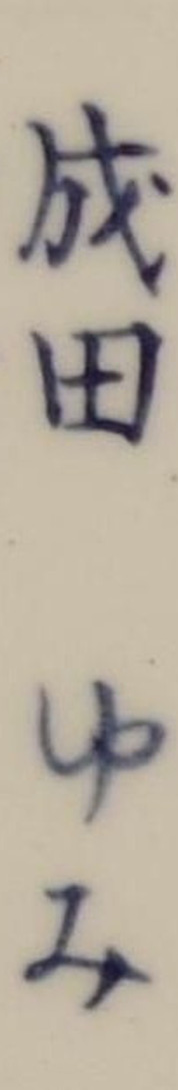成田ゆみ
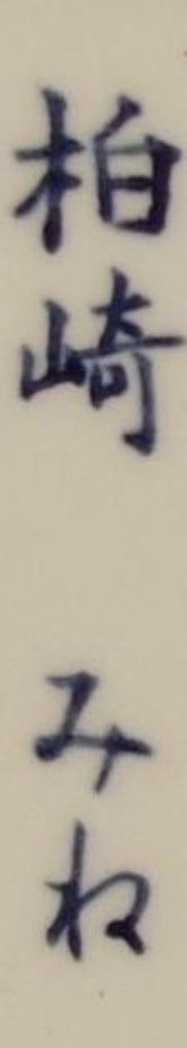柏崎みね
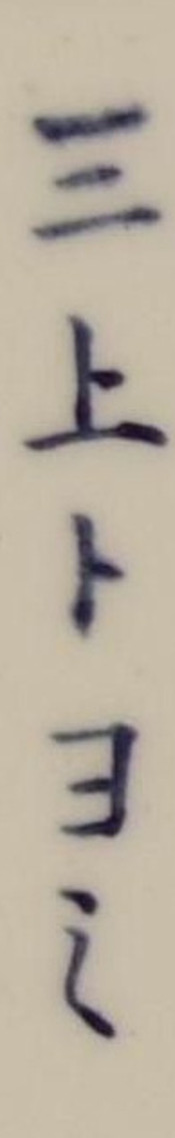三上トヨミ
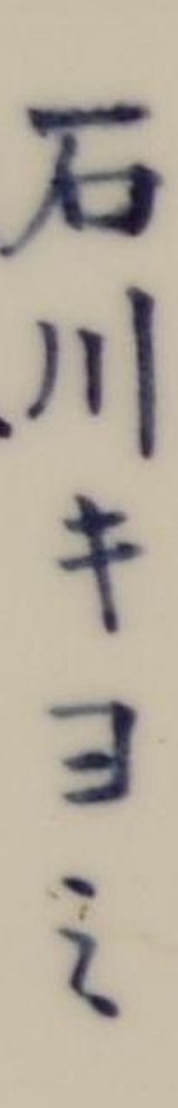石川キヨミ

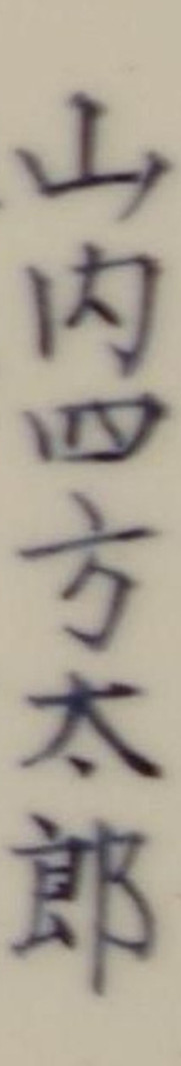山内四方太郎
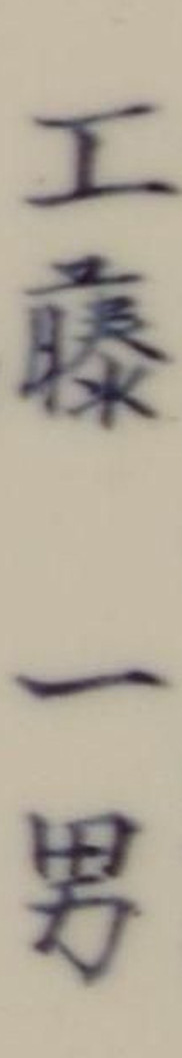工藤一男
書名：M~S
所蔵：高野山金剛峯寺
